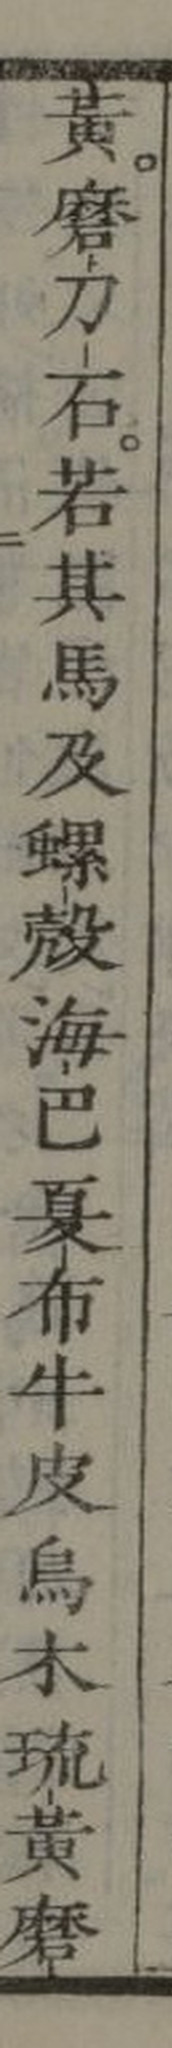黃。磨-刀-石。若其馬及螺-殻海-巴夏-布牛皮烏木琉-黃磨-
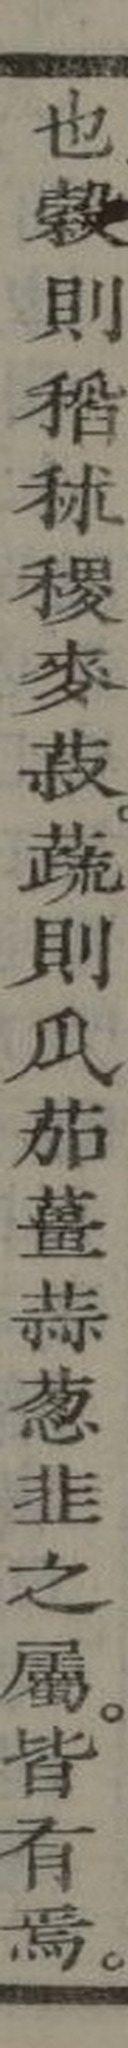也。穀則稻秫稷麥菽。蔬則瓜茄薑蒜葱韭之屬。皆有焉。
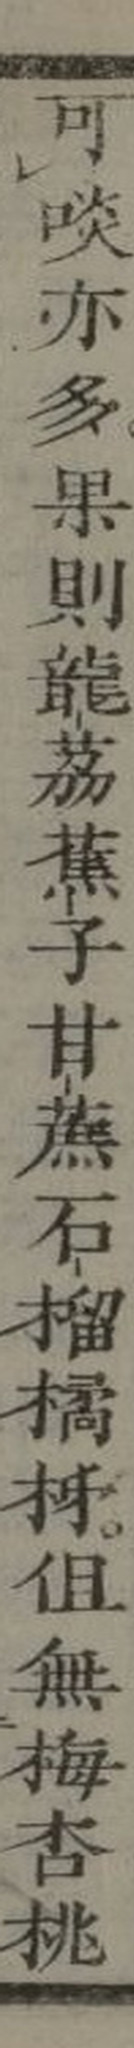可啖亦多。果則龍-茘蕉-子甘-蔗石-榴橘柹。伹無梅杏桃
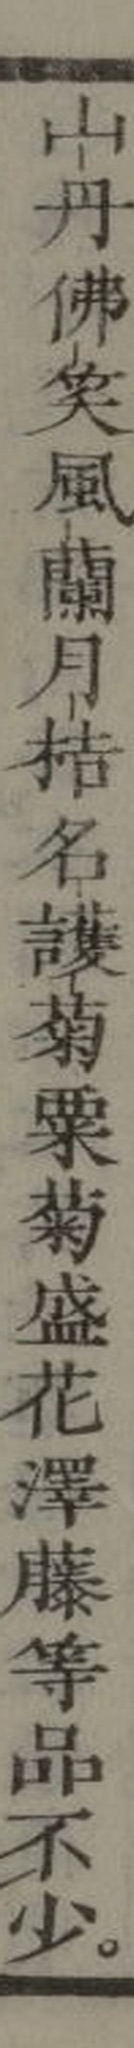山-丹佛-笑風-蘭月-桔名-護-菊粟菊盛花澤藤等品不少。

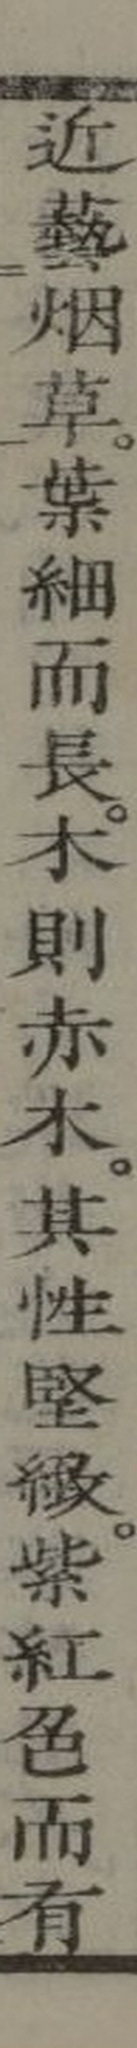近藝烟草。葉細而長。木則赤木。其性堅緻。紫紅色而有
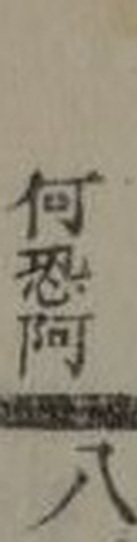何恐阿
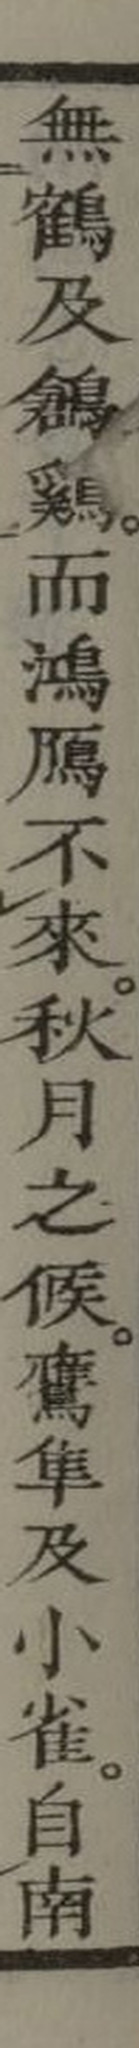無鶴及鶬鷄。而鴻鴈不來。秋月之候。鷹隼及小雀。自南
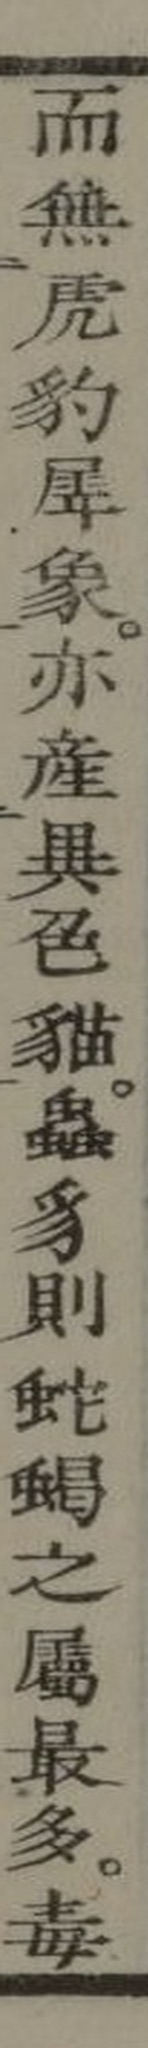而無虎豹犀象。亦産異色貓。蟲豸則蛇蝎之屬最多。毒
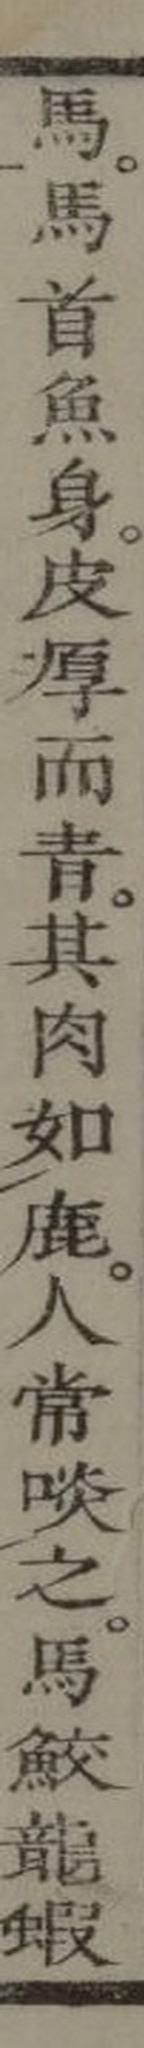馬。馬首魚身。皮厚而青。其肉如鹿。人常啖之。馬鮫龍蝦
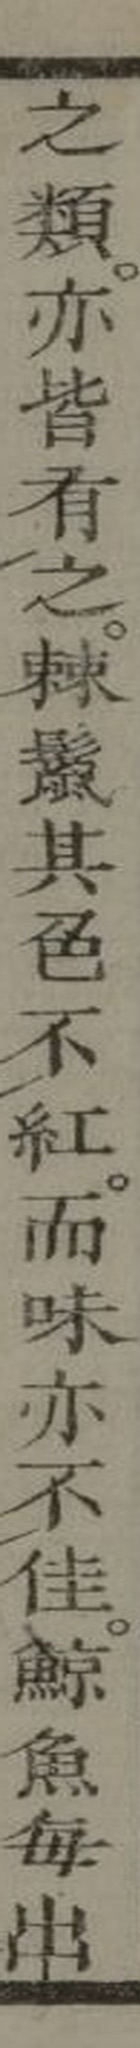之類。亦皆有之。棘鬛其色不紅。而味亦不佳。鯨魚每出-
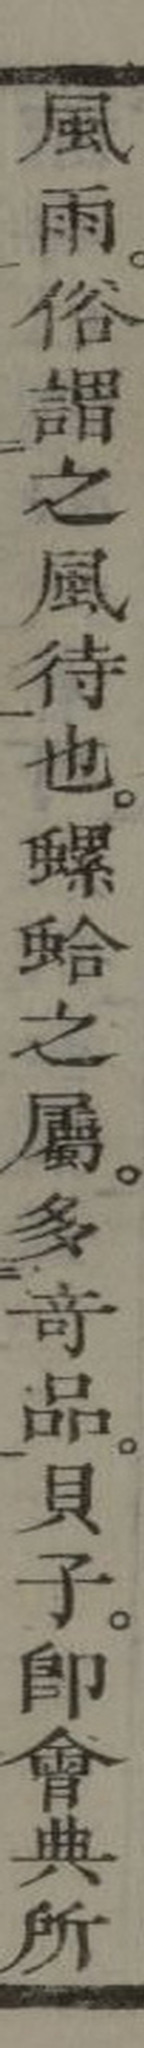風雨。俗謂之風待也。螺蛤之屬。多竒品。貝子。卽會典所
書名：南島志 呂
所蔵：University of the Ryukyus Library
